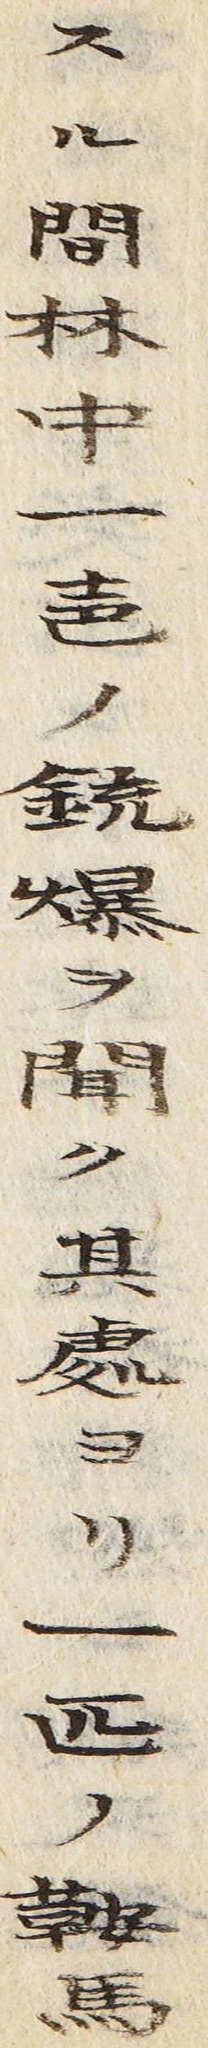スル間林中一声ノ銃爆ヲ聞ク其処ヨリ一匹ノ鞍馬
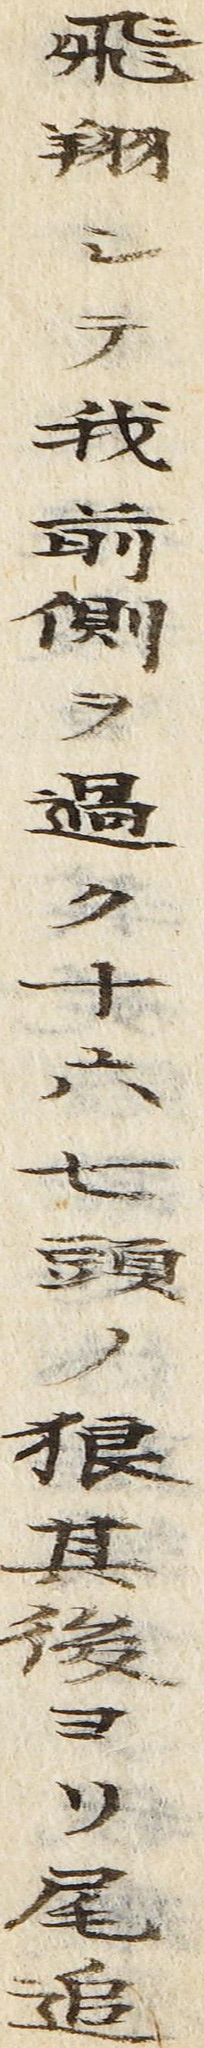飛翔シテ我前側ヲ過ク十六七頭ノ狼其後ヨリ尾追
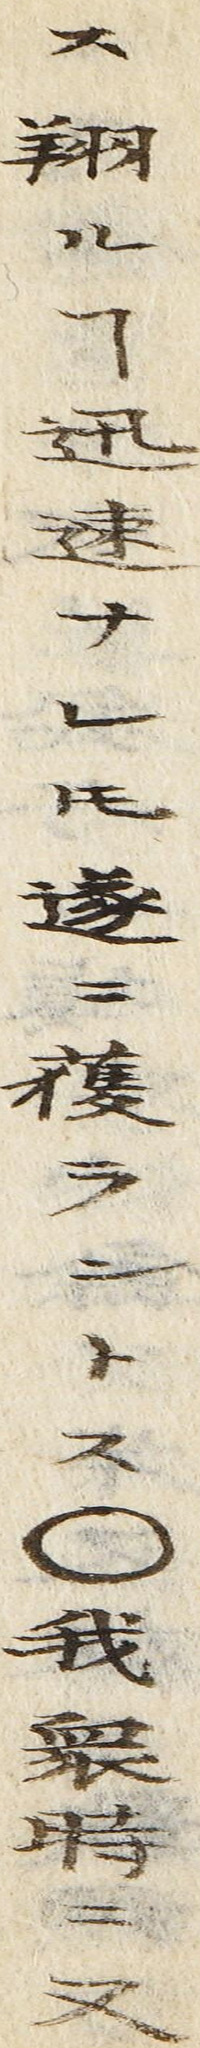ス翔ルコト迅速ナレトモ遂ニ獲ラントス◯我衆時ニ又
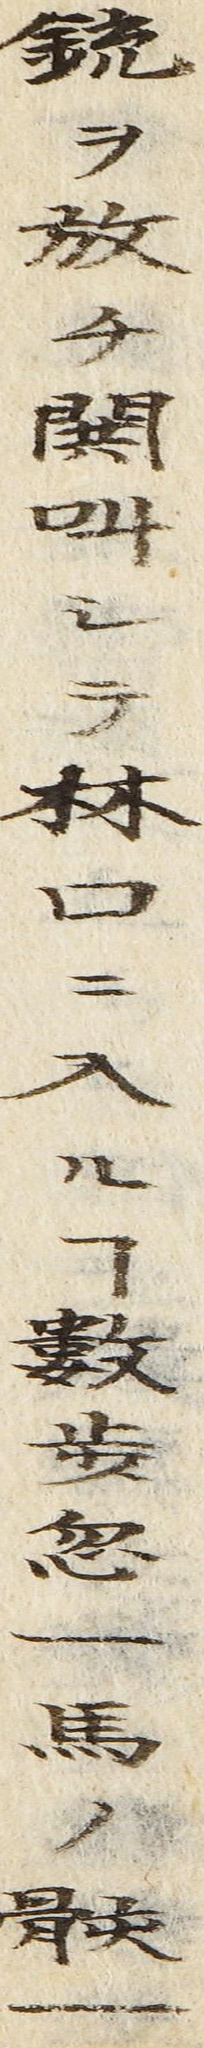銃ヲ放チ鬨叫シテ林口ニ入ルコト数歩忽一馬ノ骸一
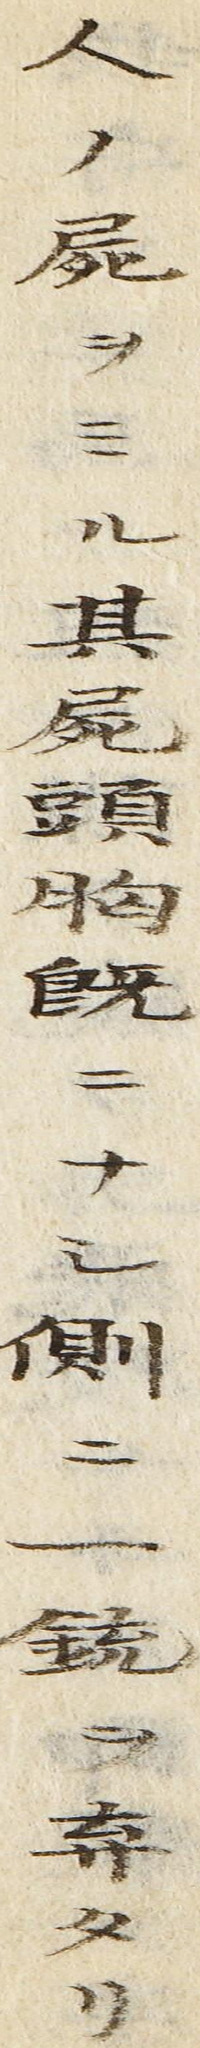人ノ屍ヲミル其屍頭胸既ニナシ側ニ一銃ヲ弃タリ
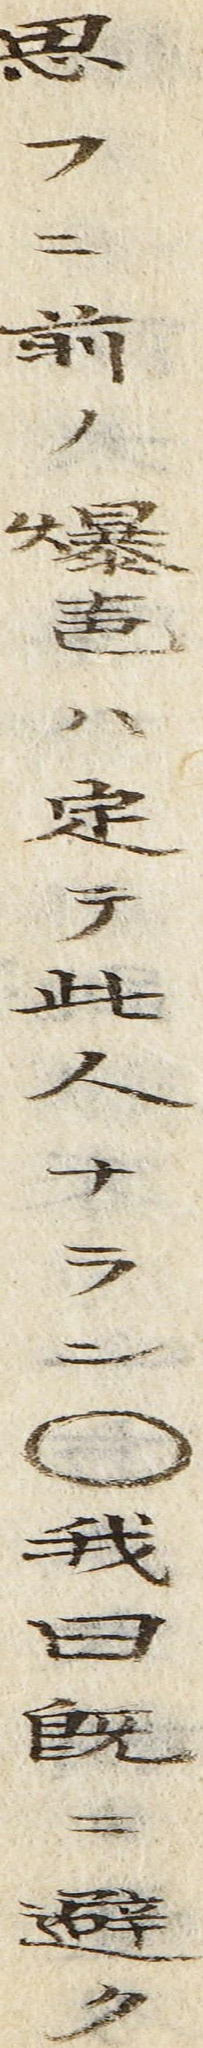思フニ前ノ爆声ハ定テ此人ナラン◯我曰既ニ避ク
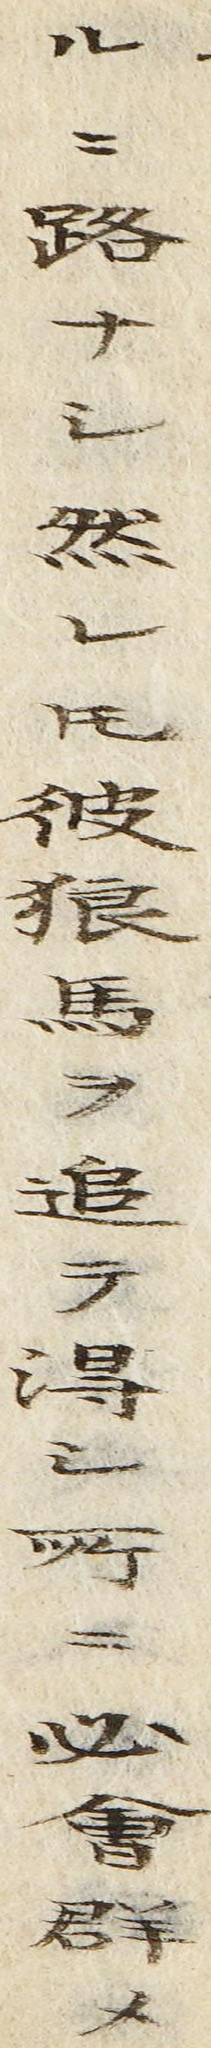ルニ路ナシ然レトモ彼狼馬ヲ追テ得シ所ニ必会群シテ
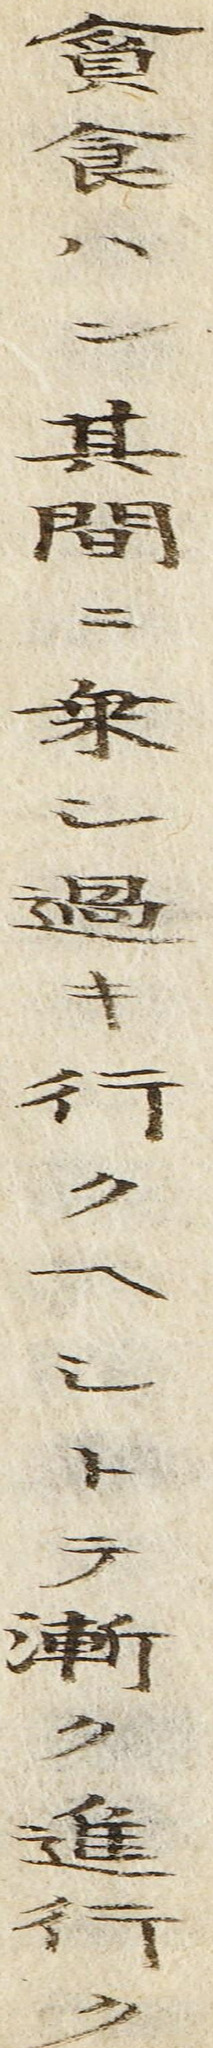貪食ハン其間ニ乗シ過キ行クヘシトテ漸ク進行ク
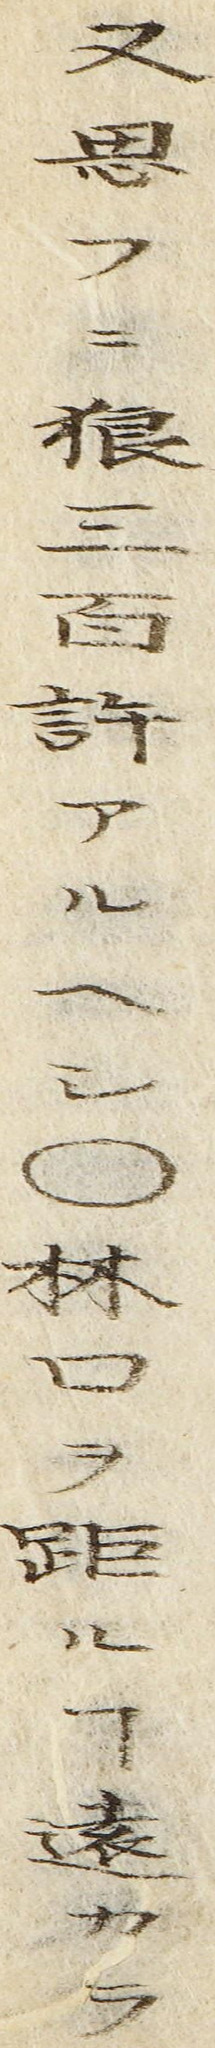又思フニ狼三百許アルヘシ◯林口ヲ距ルコト遠カラ

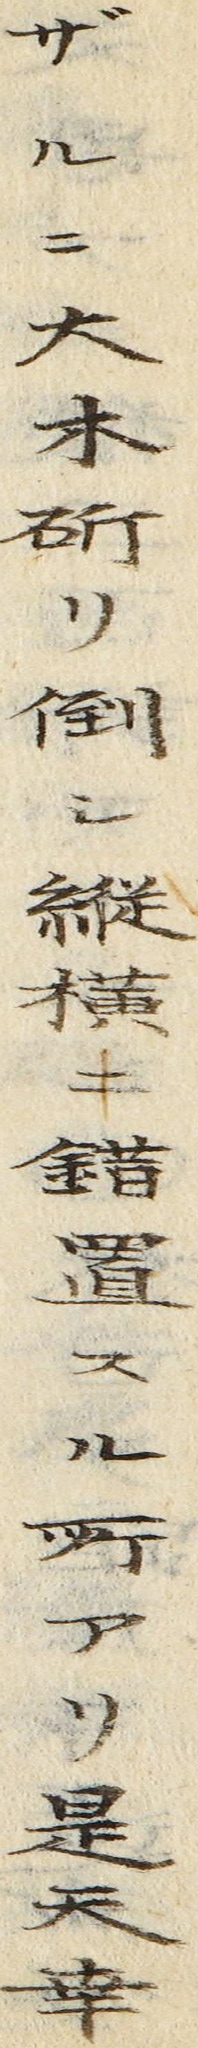ザルニ大木斫リ倒シ縦横ニ錯置スル所アリ是天幸
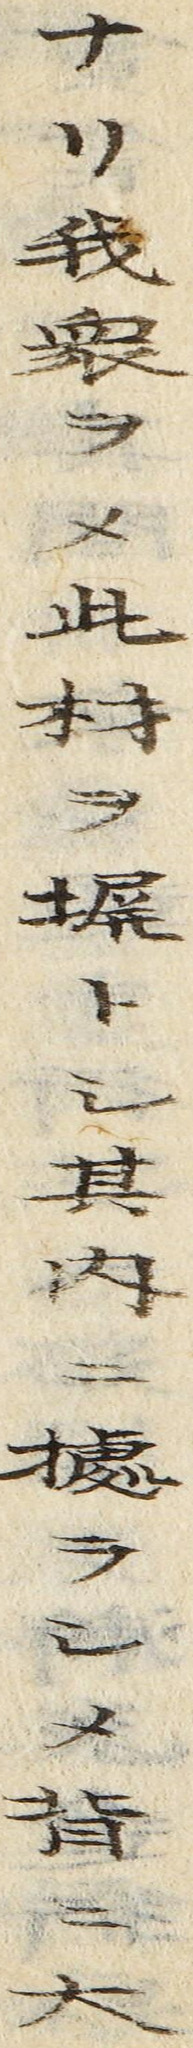ナリ我衆ヲシテ此材ヲ塀トシ其内ニ拠ラシメ背ニ大
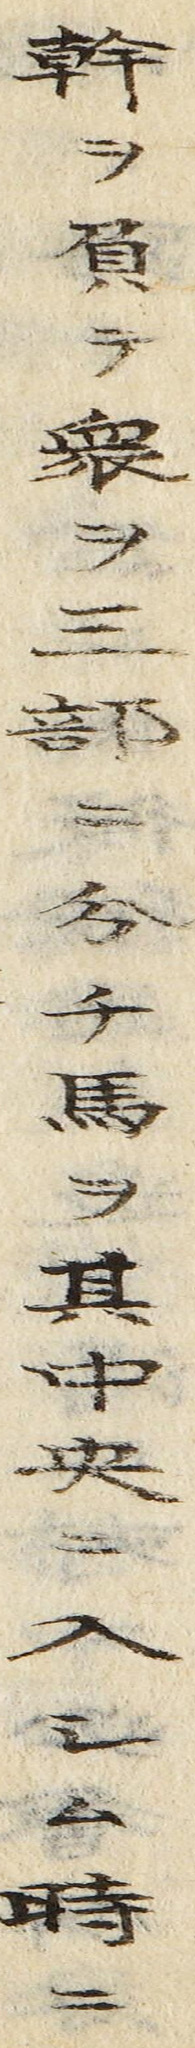幹ヲ負テ衆ヲ三部ニ分チ馬ヲ其中央ニ入シム時ニ
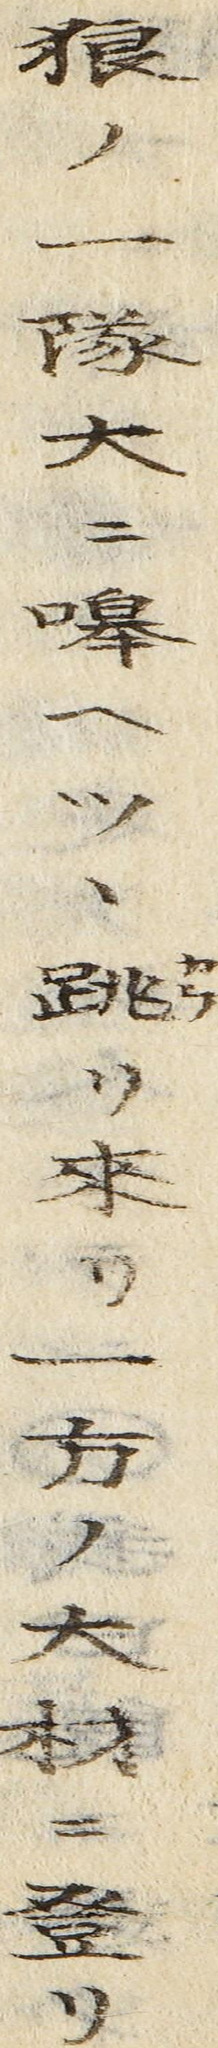狼ノ一隊大ニ嗥ヘツヽ跳リ来リ一方ノ大材ニ登リ
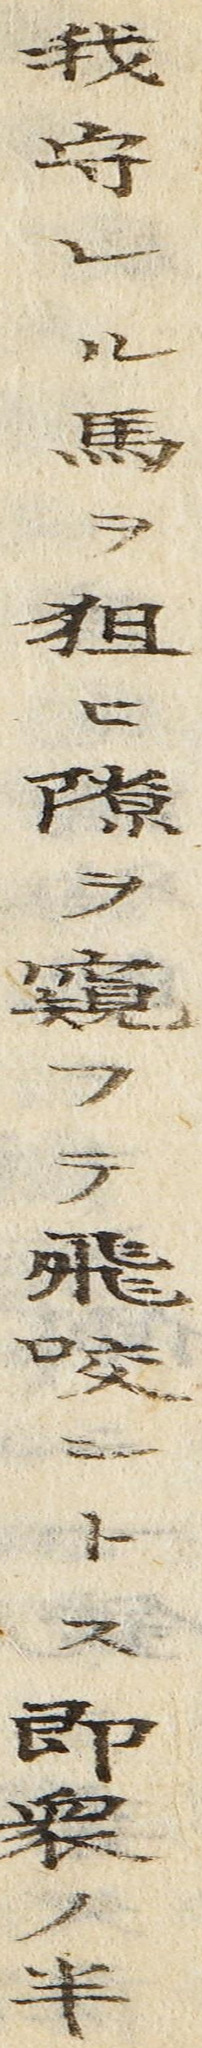我守レル馬ヲ狙ヒ隙ヲ窺フテ飛咬ントス即衆ノ半
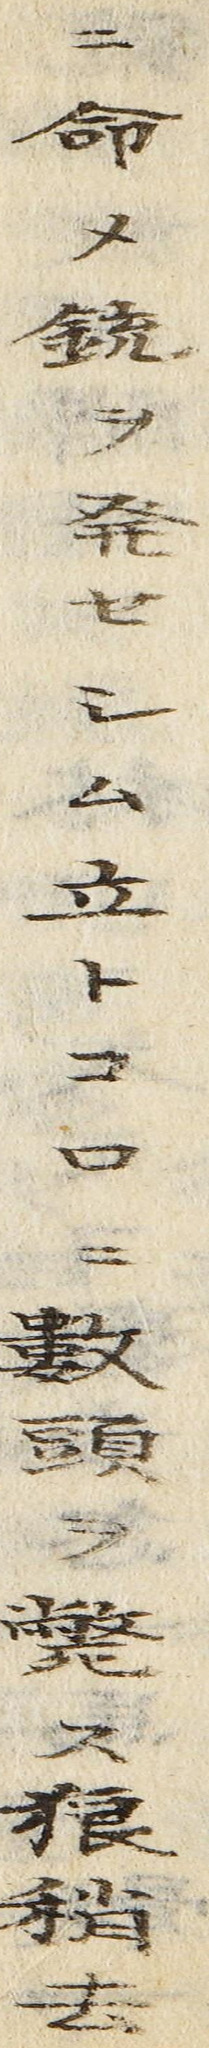ニ命シテ銃ヲ発セシム立トコロニ数頭ヲ斃ス狼稍去
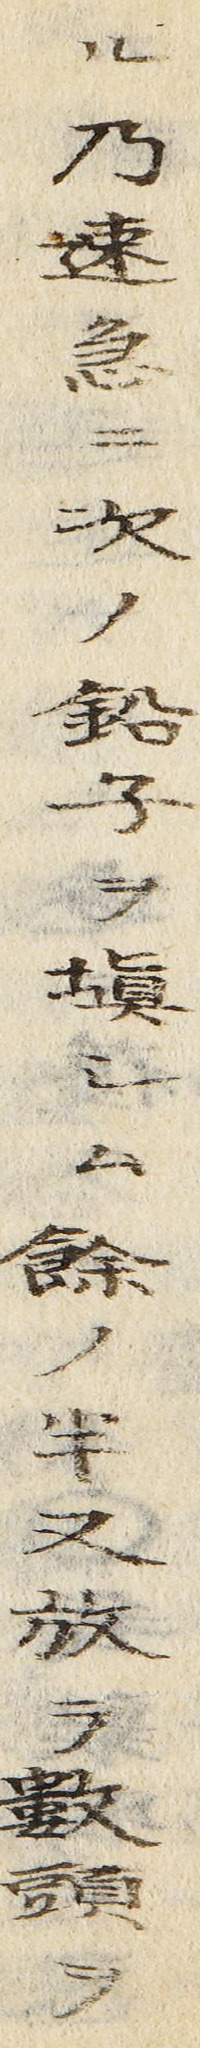ル乃速急ニ次ノ鉛子ヲ填シム余ノ半又放テ数頭ヲ
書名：漂流紀事
